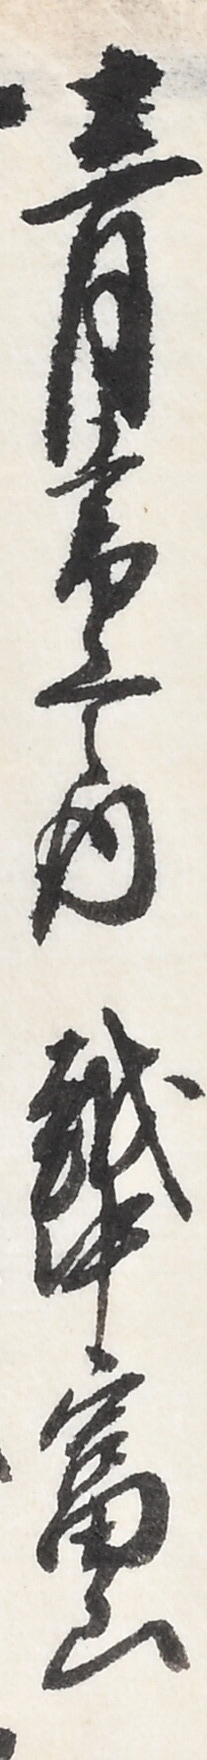十二月書上之内越中富山
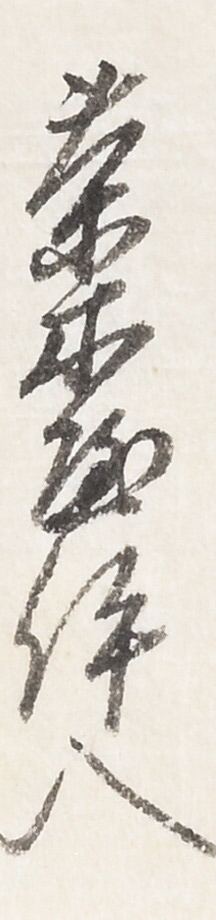茶木屋伊八
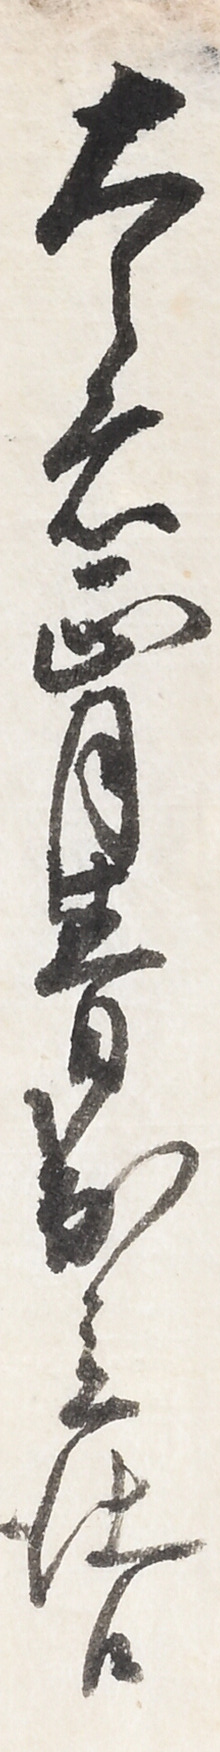右之者正月三日出立仕候
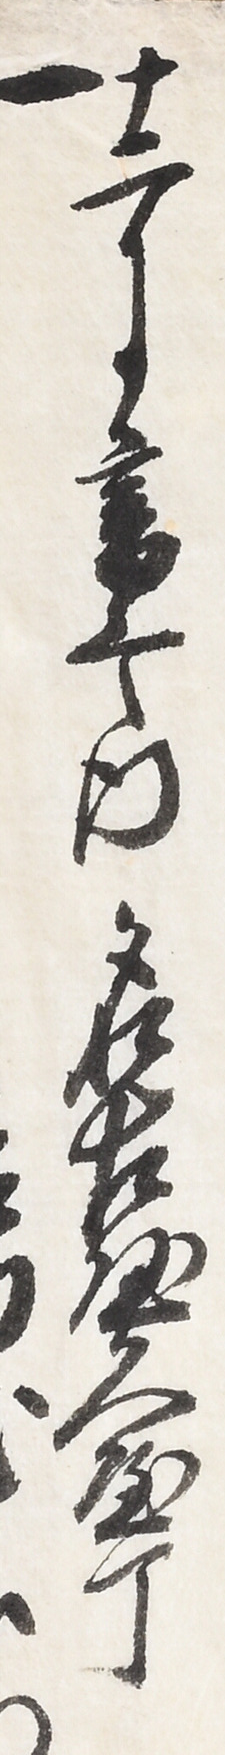十二月書上之内名古屋久屋町
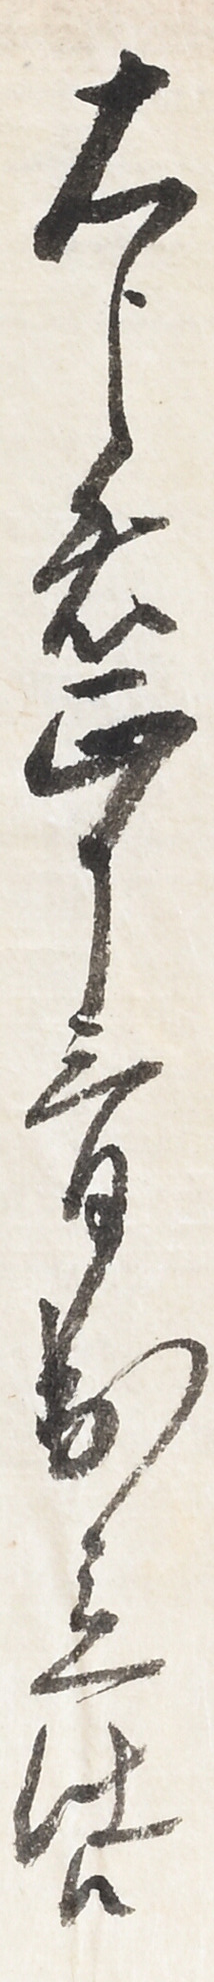右之者正月三日出立仕候
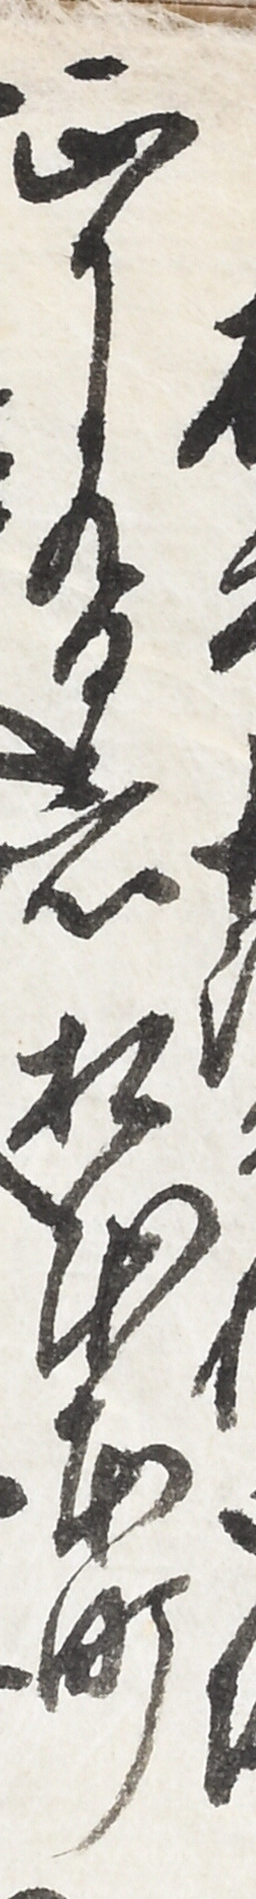正月九日着松本本町
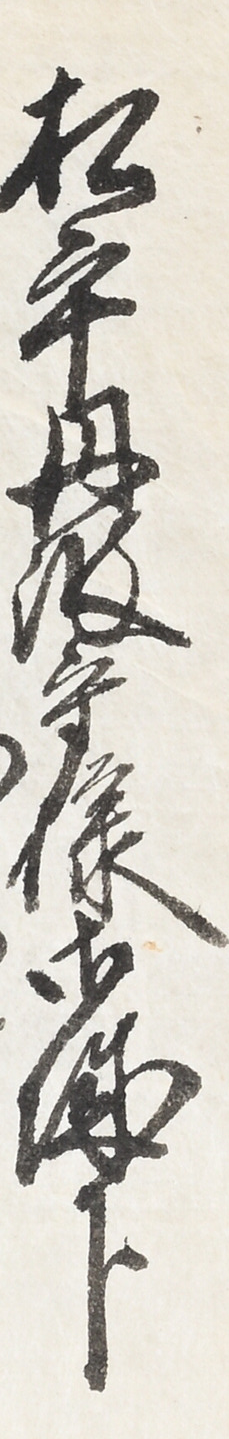松平丹波守様御城下
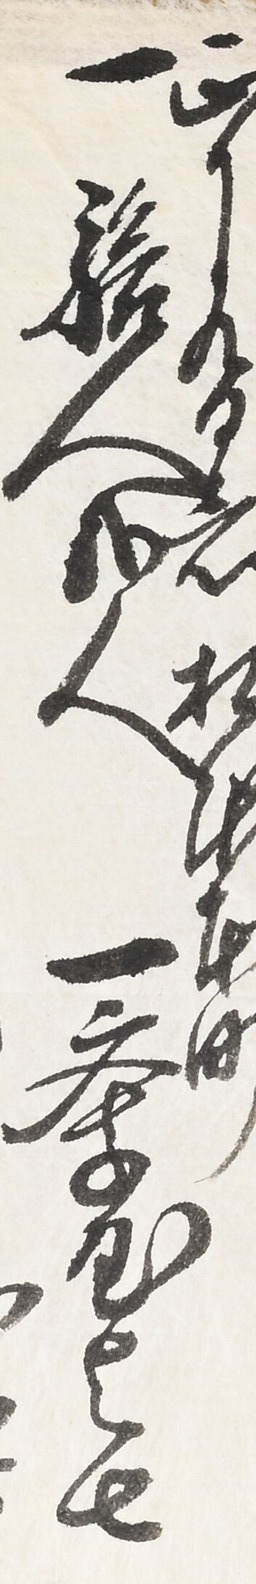一旅人弐人一文字屋与七
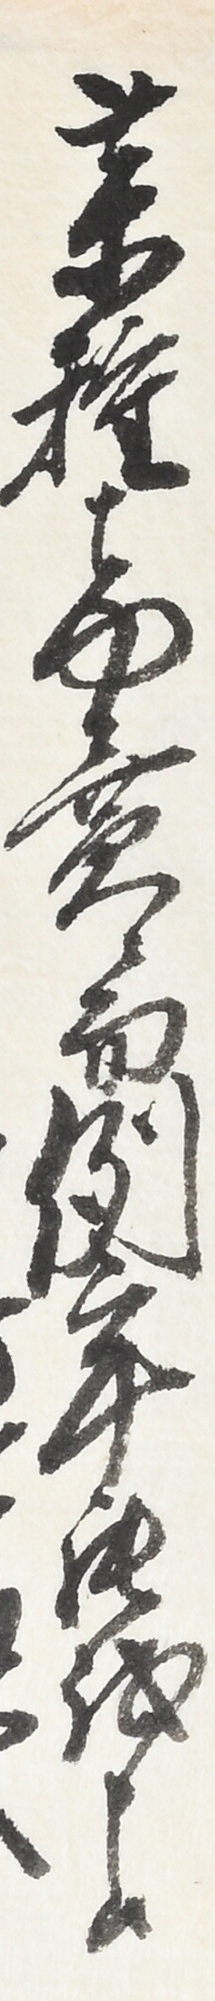薬種商売ニ而例年罷越申候
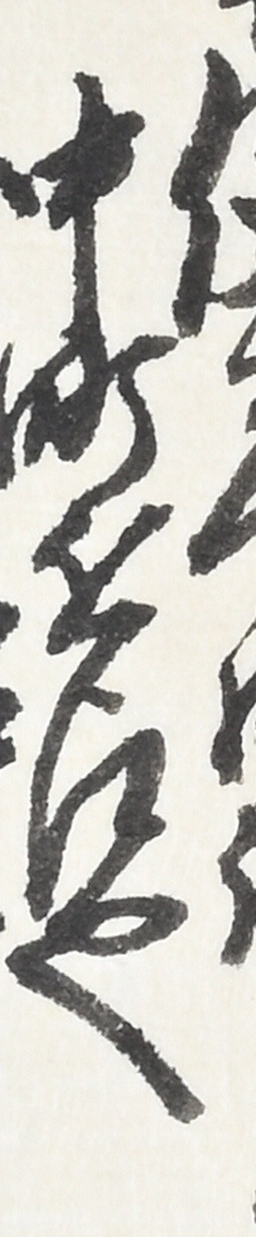中町近江や
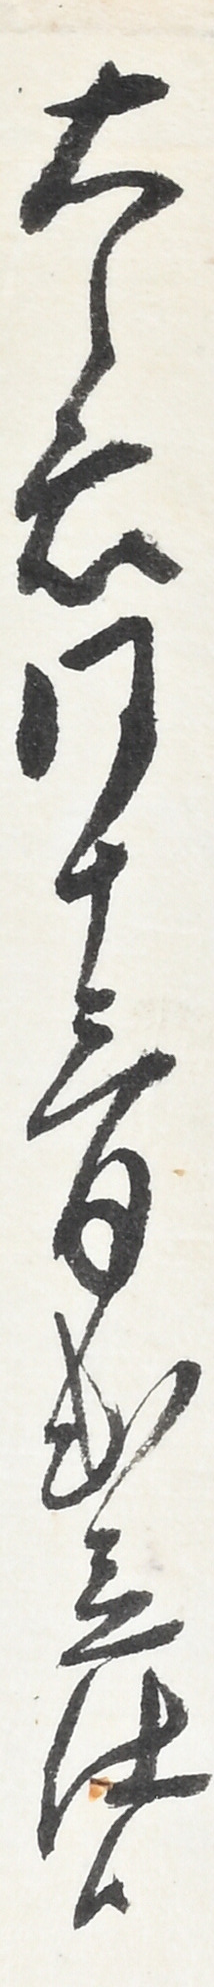右之者同十三日出立仕候

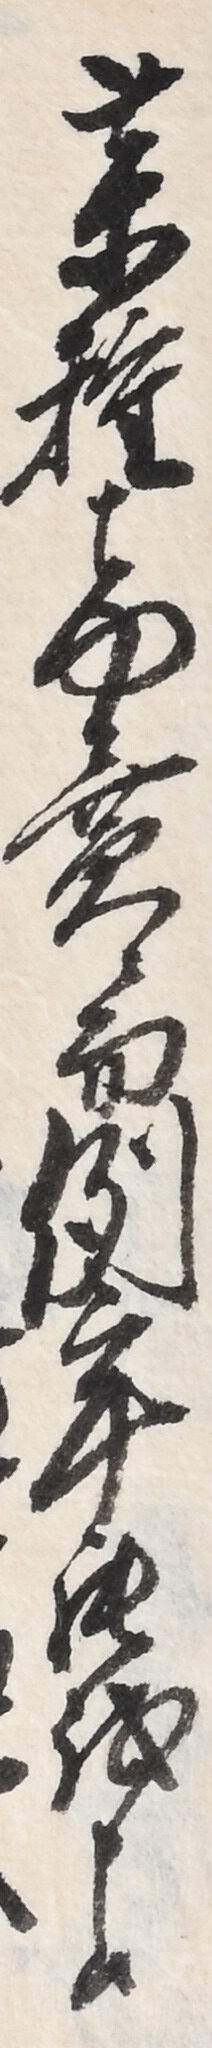薬種商売ニ而例年罷越申候
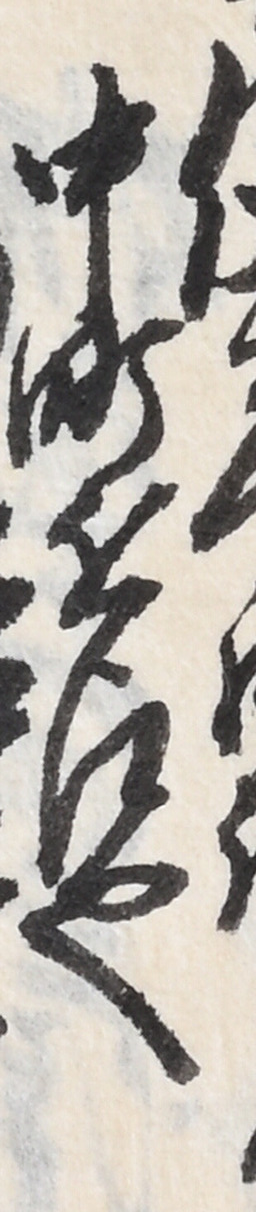中町近江屋
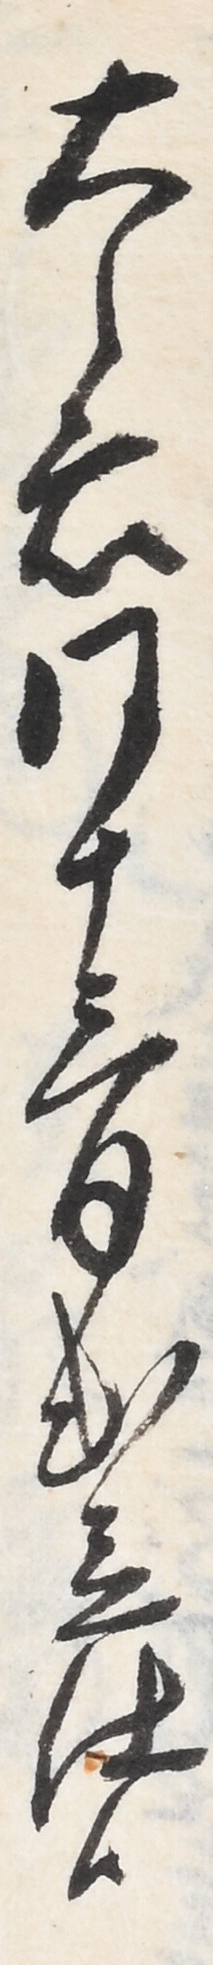右之者同十三日出立仕候
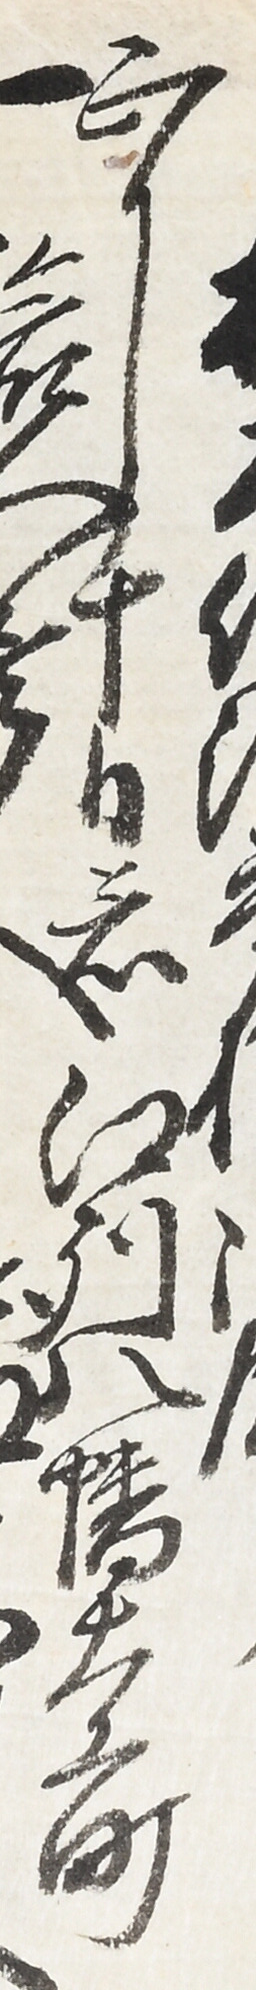正月十日着江州八幡大工町
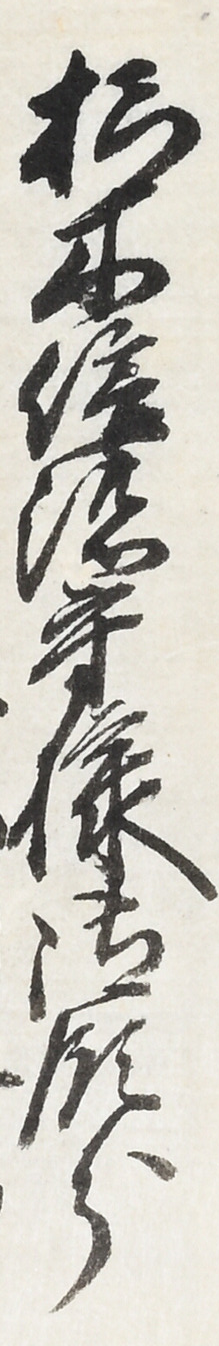朽木信濃守様御領分
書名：旅人泊控帳
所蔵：伊那市立高遠町図書館・合同会社AMANE
